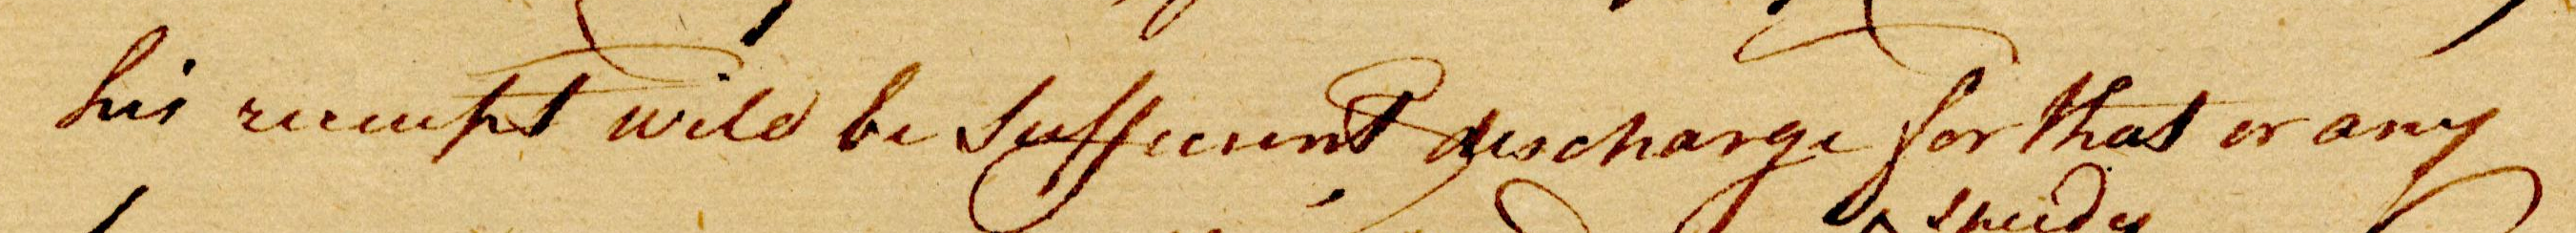his receipt will be Sufficient Discharge for that or any
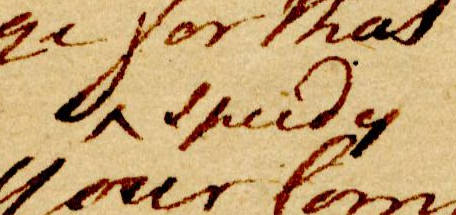Speedy
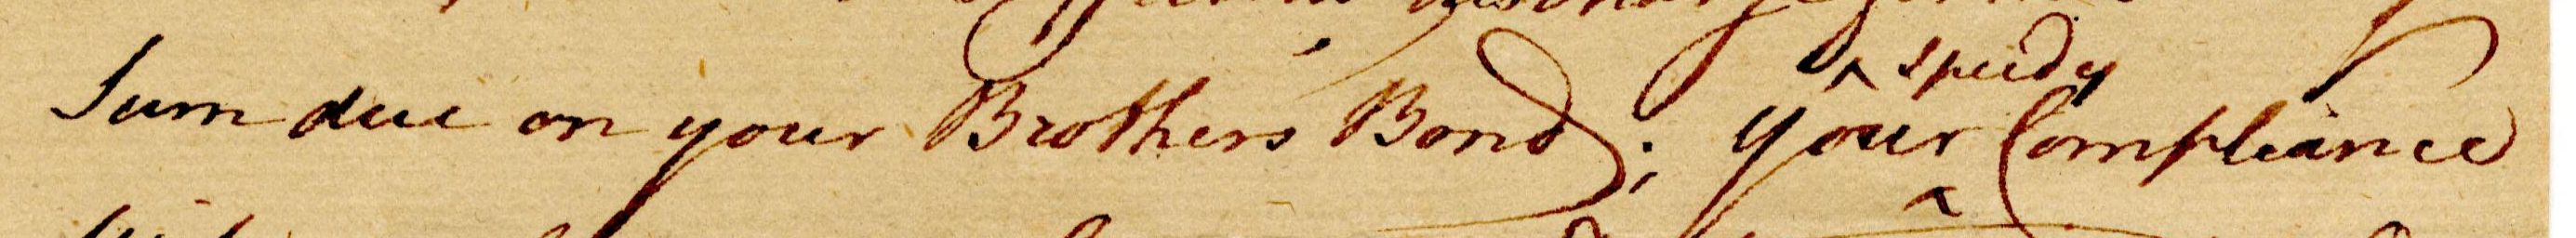Sum due on your Brothers Bond. Your ^ Compliance
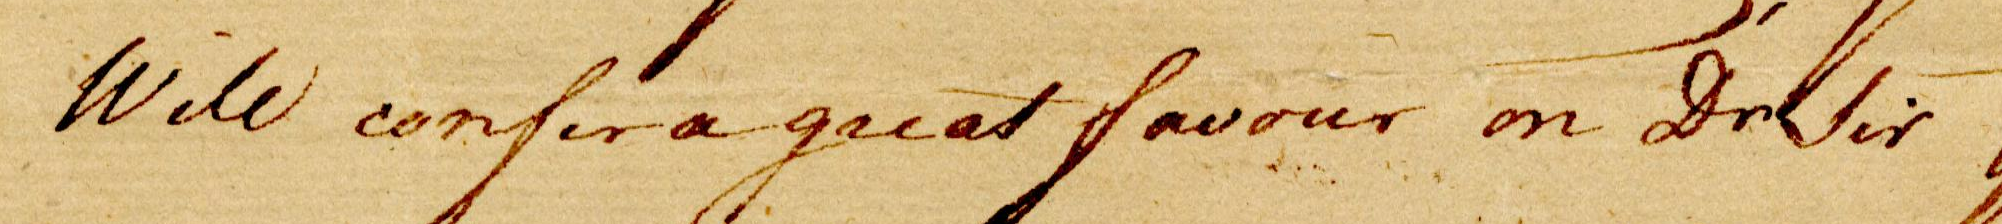Will confer a great favour on D^r Sir
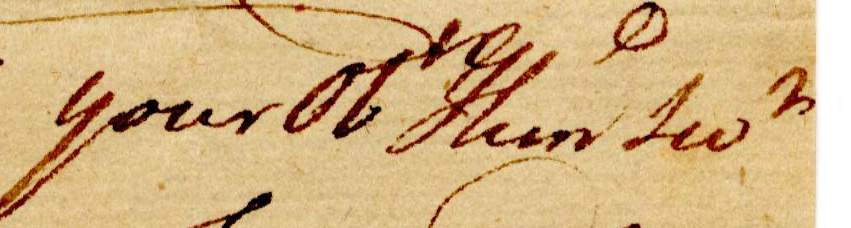your Ob^t Hum ser^t
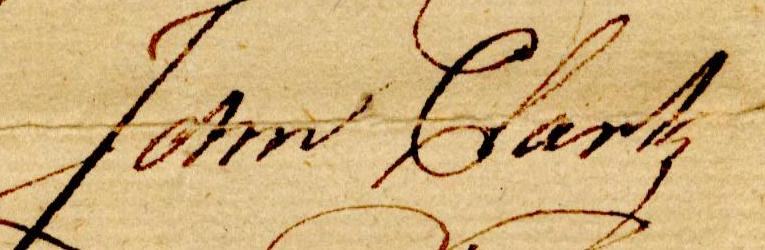John Clark
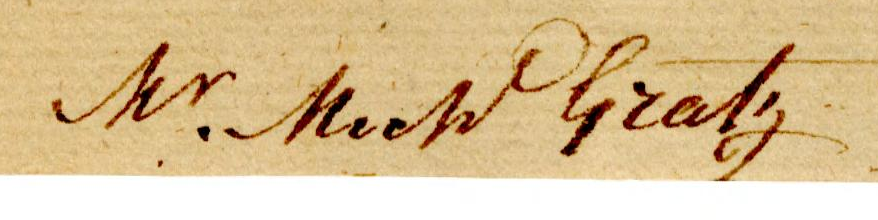M^r Mich^l Gratz
